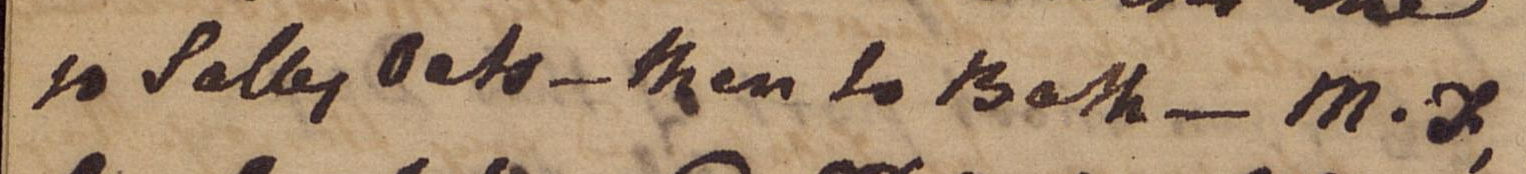to Sally Oats- then to Bath- M. F,
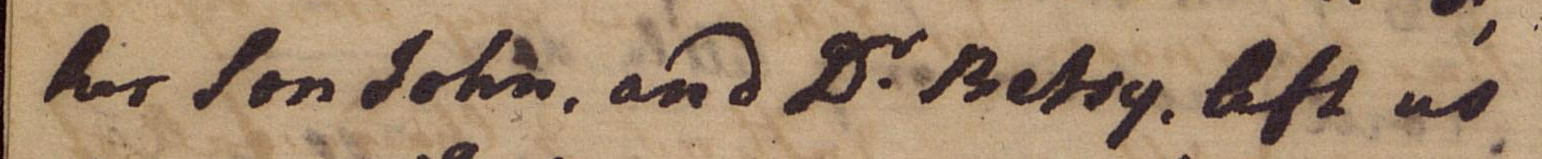her Son John, and D^r. Betsy. left us
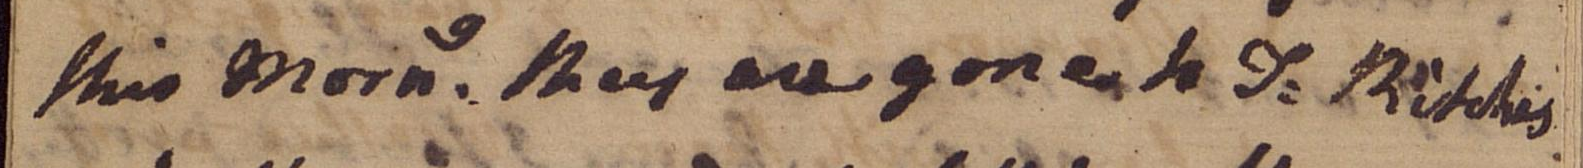this Morn^g. they are gone to T: Ritches
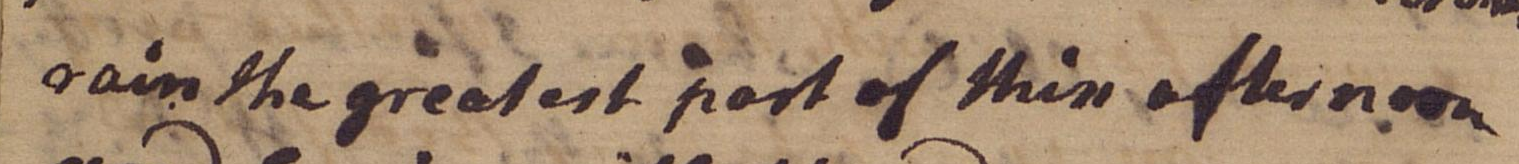rain the greatest part of thin afternoon
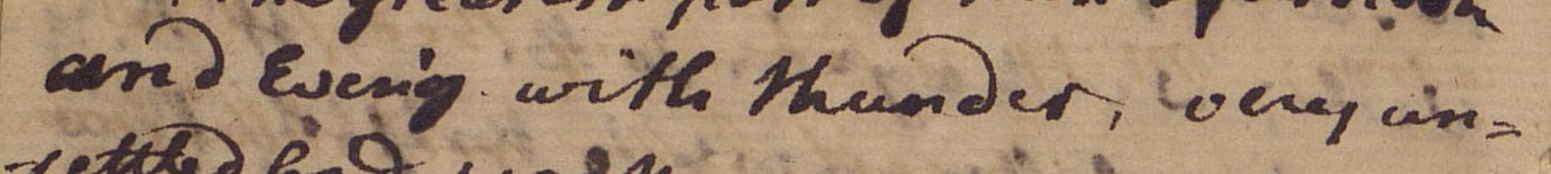and Even'g with thunder, very un-
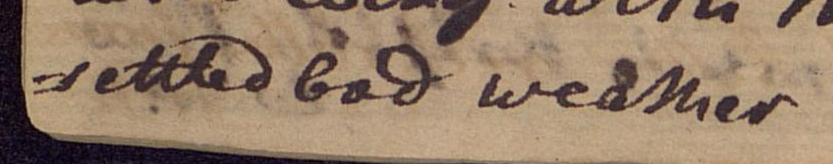-settled bad weather
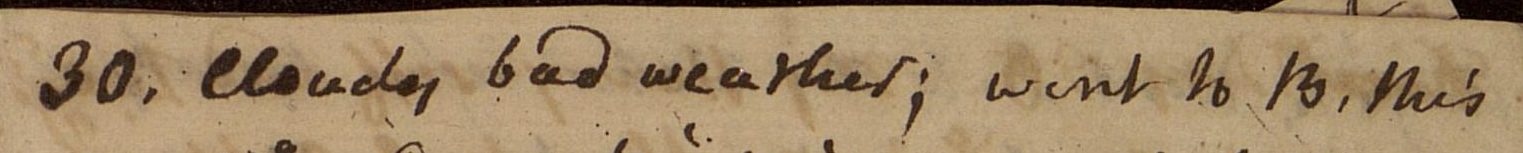30. cloudy bad weather; went to B. this
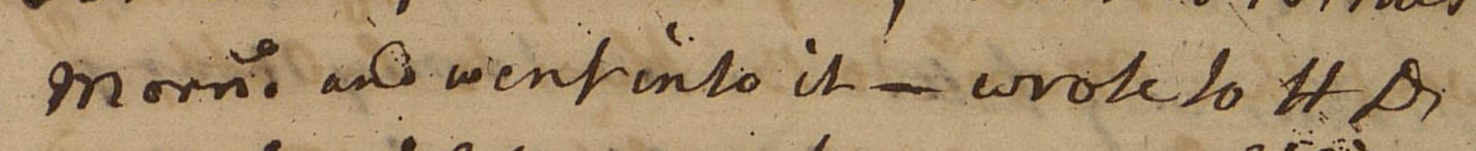Morn^g. and went into it- wrote to HD
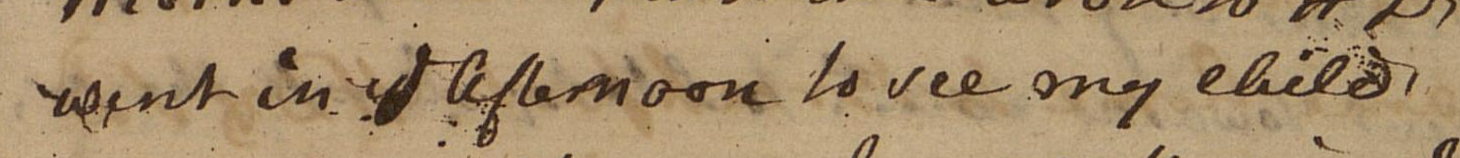went in y^e Afternoon to see my child
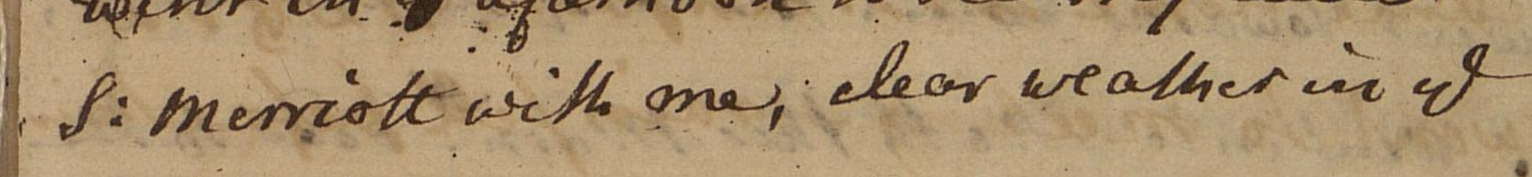S: Merriott with me, clear weather in y^e
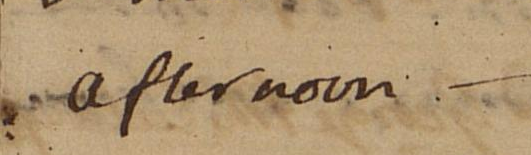afternoon-
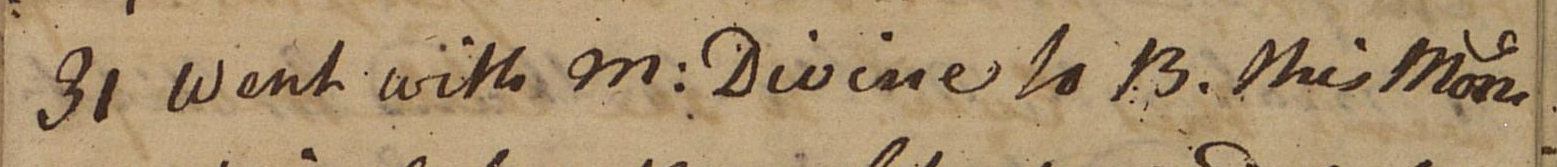31 went with M: Divine to B. this Morn^g.
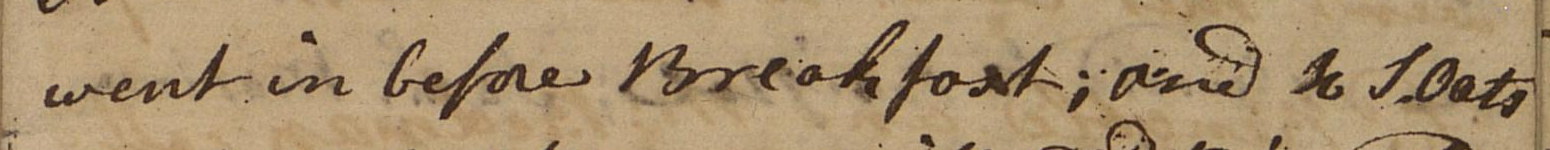went in before Breakfast; and to S. Oats
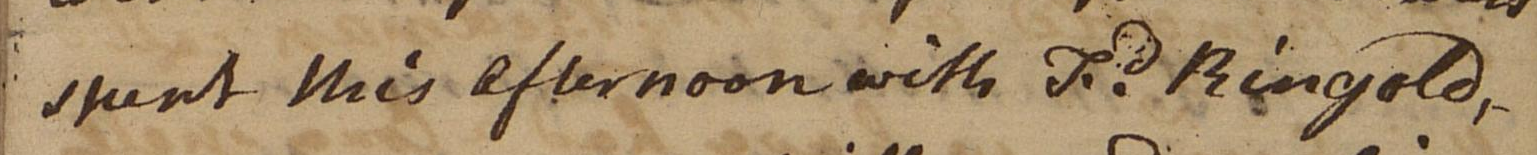spent this afternoon with F^d. Ringold,-
